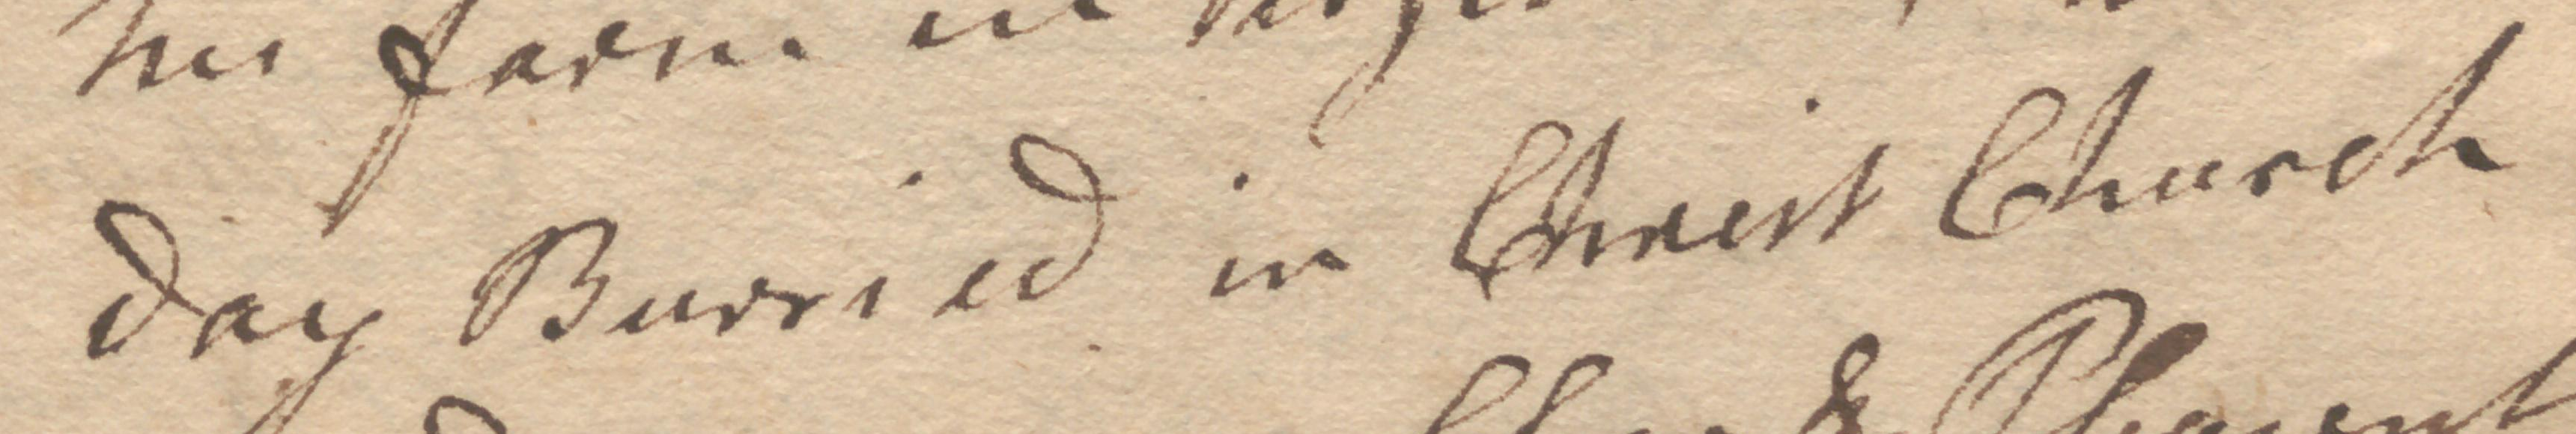day Burried in Christ Church
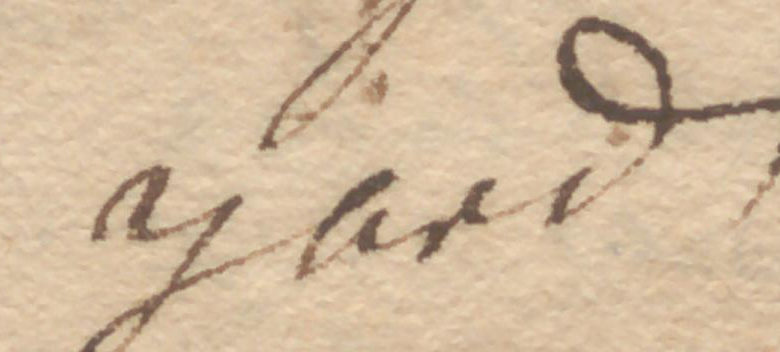yard
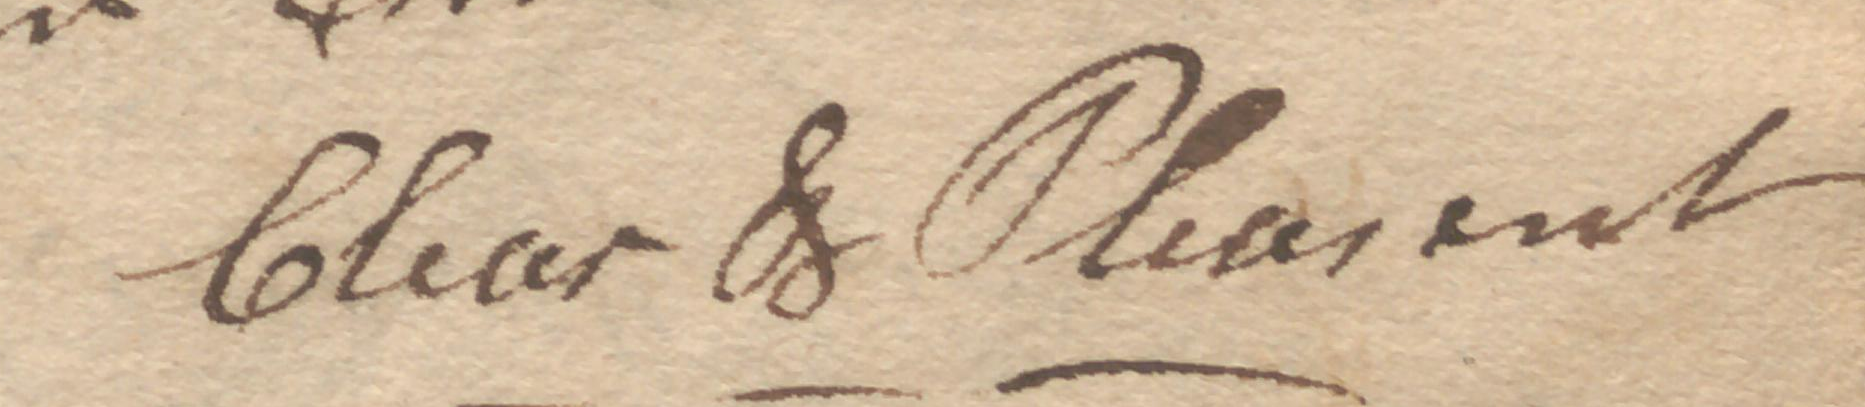Clear & Pleasent
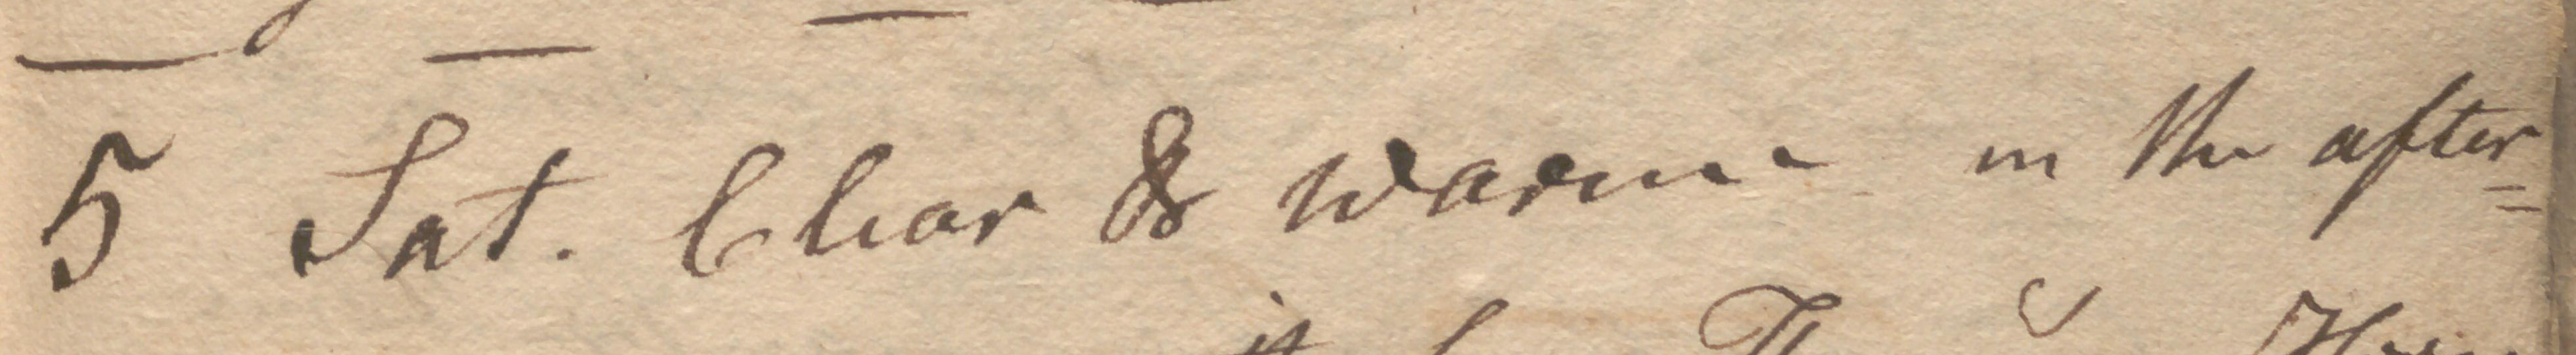5 Sat. Clear & warme in the after
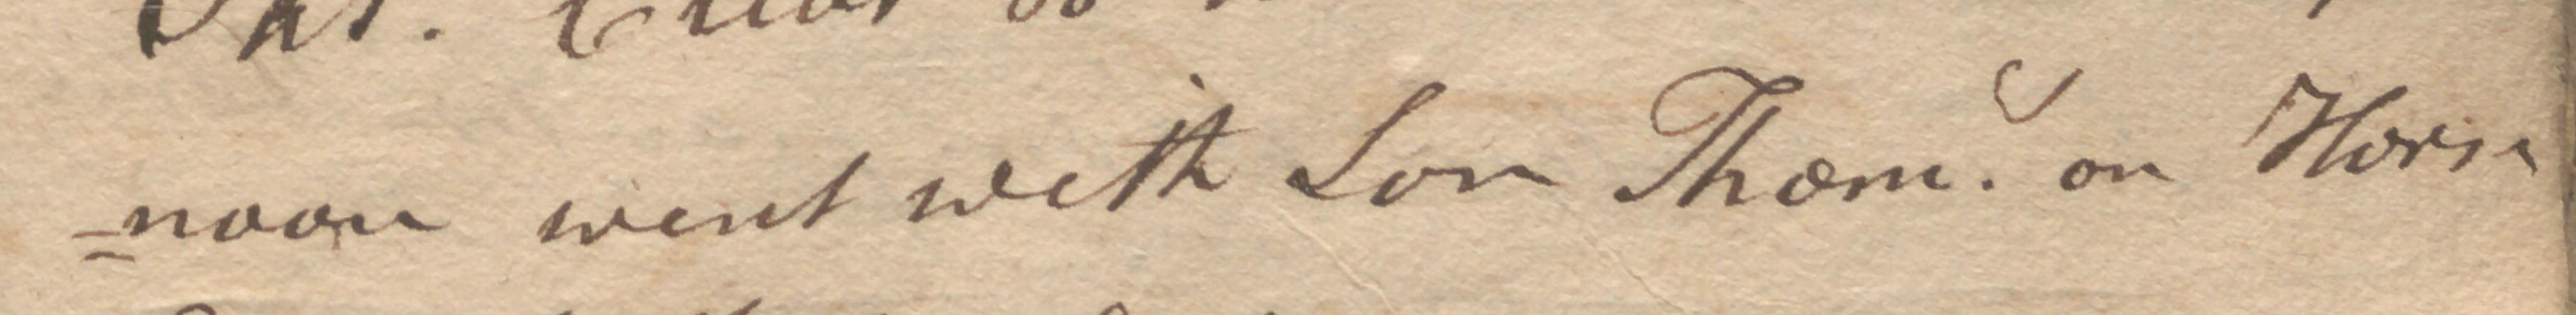noon went with Son Thom^s. on Horse
